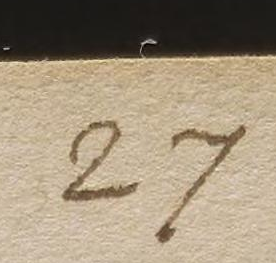27
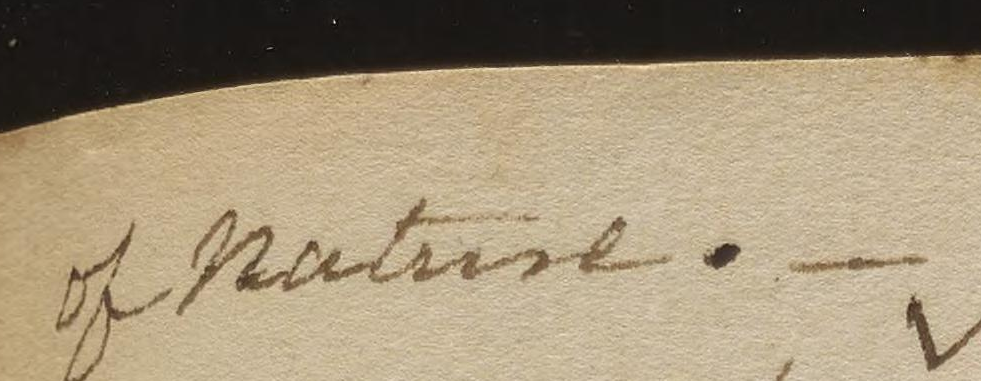of nature
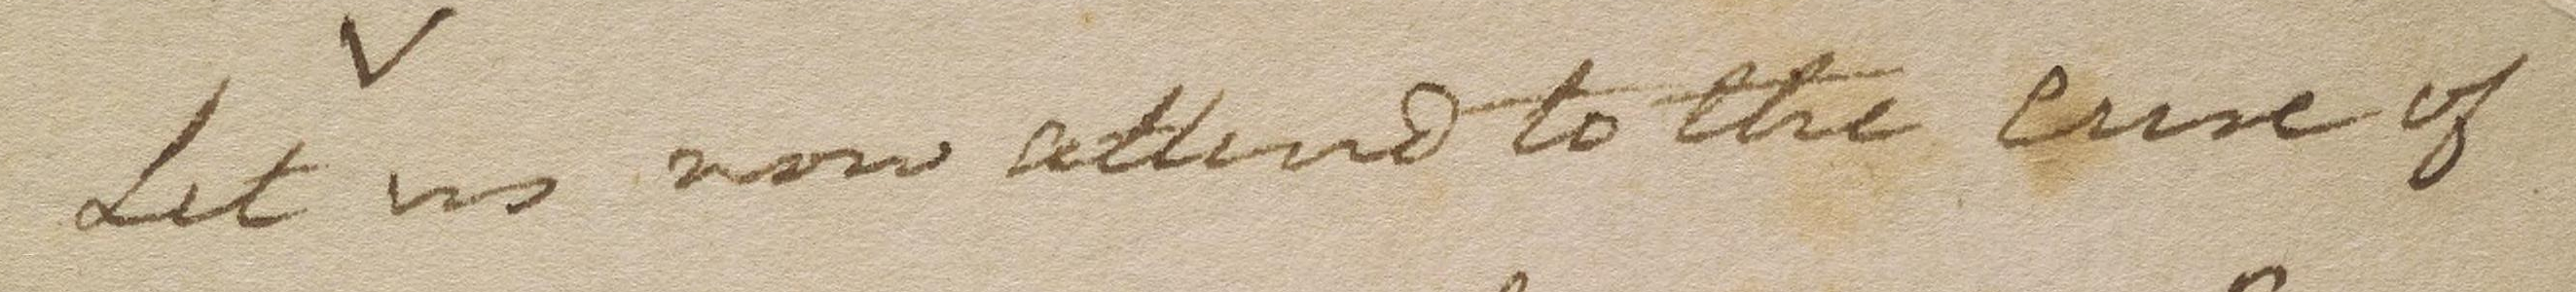Let us now attend to the cure of
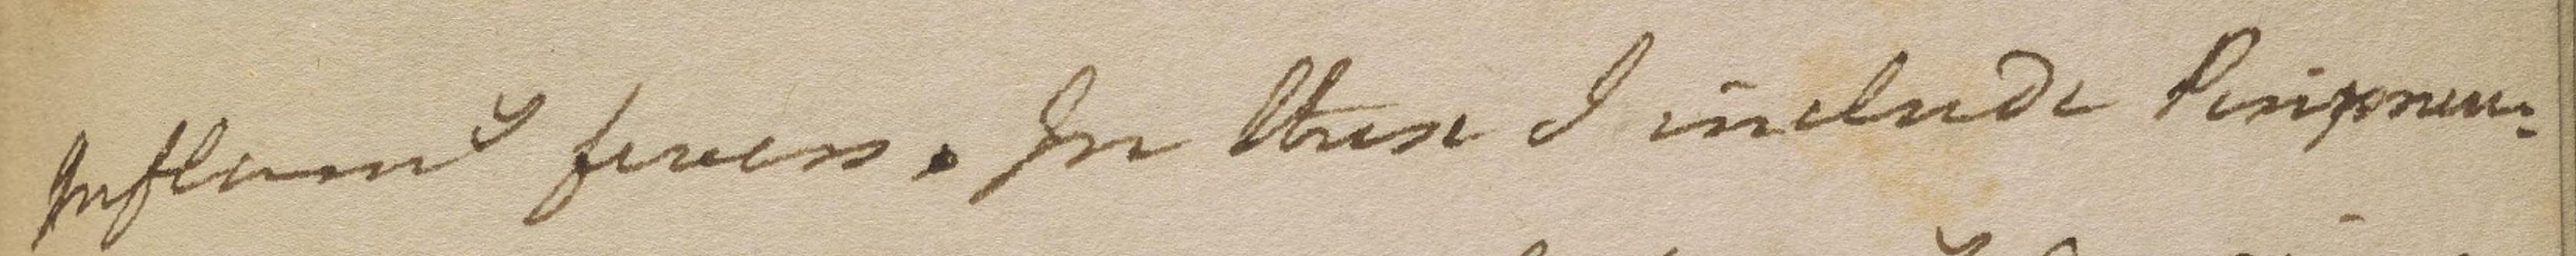inflam^y fevers. In these I include Pneumo
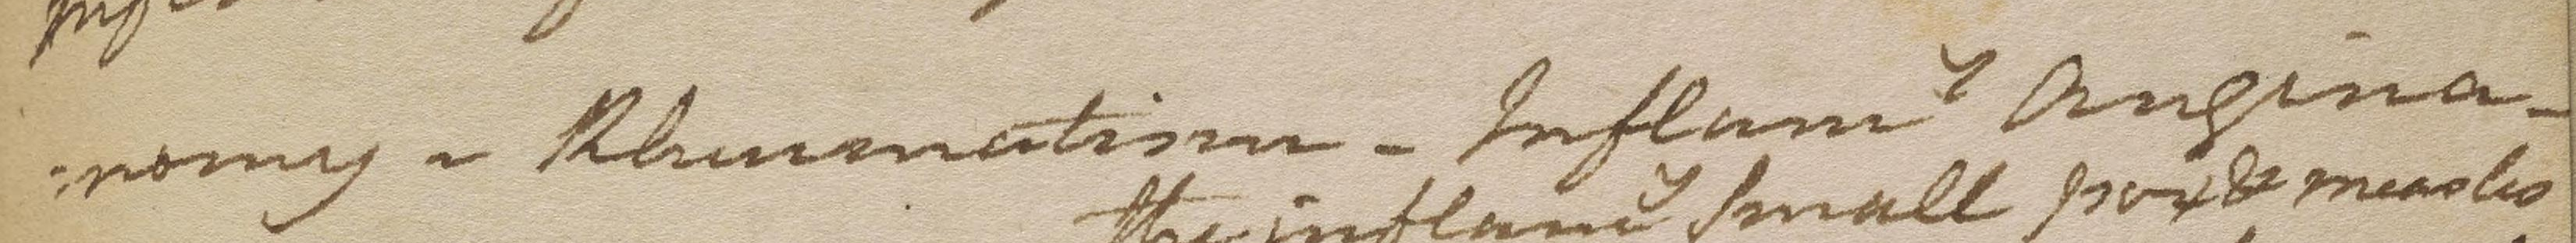-nomy- Rheumatism- Inflam^y Angina-
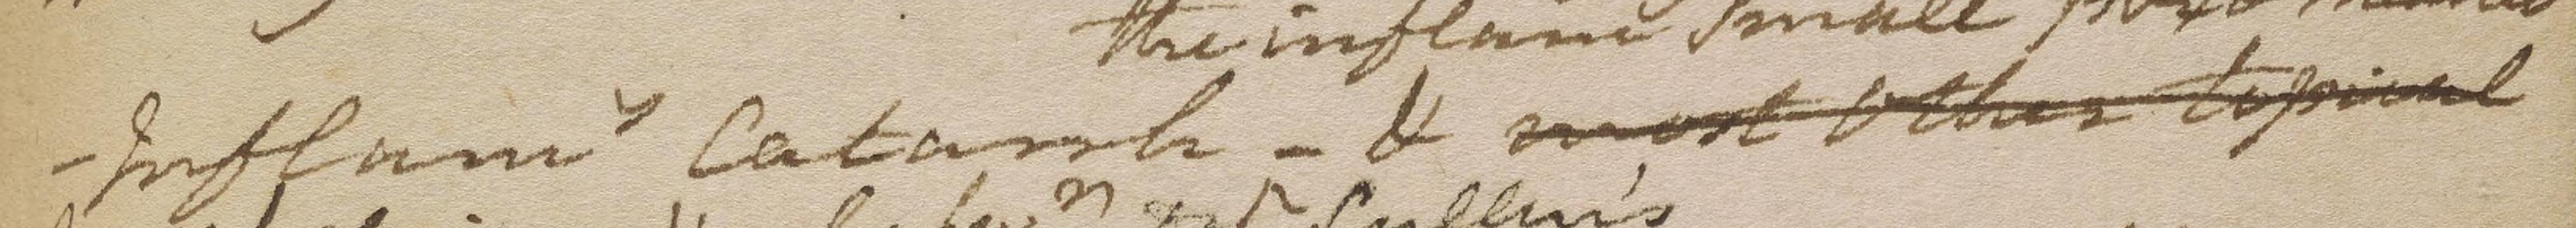Inflam^y Catarrh- & [most other topical]
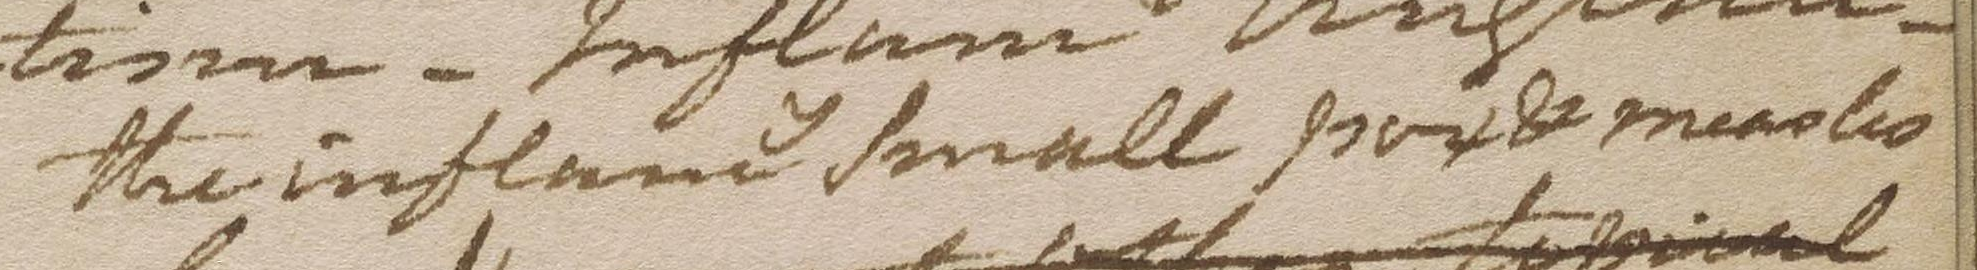the inflam^y Small pox & measles
